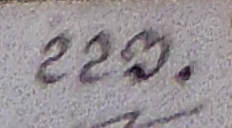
223.
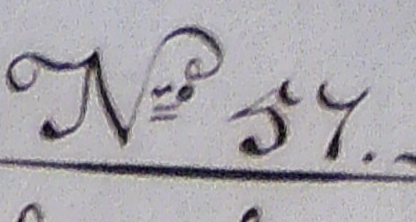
No͇ 57.
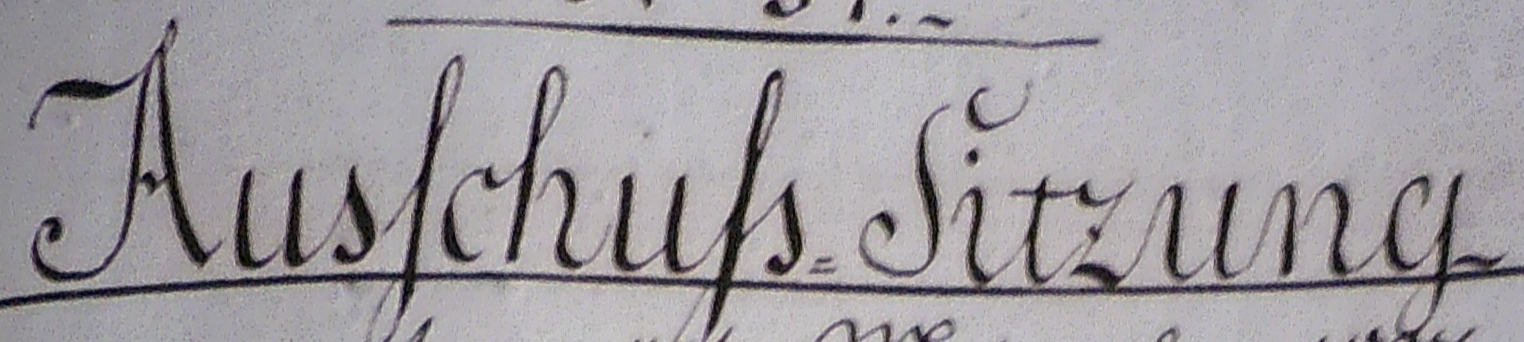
Ausschuss‗Sitzung
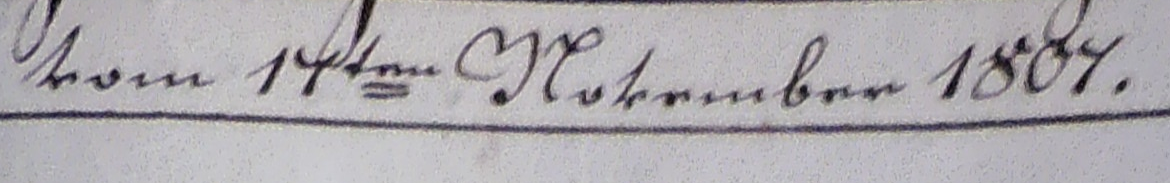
vom 17te͇n November 1807.
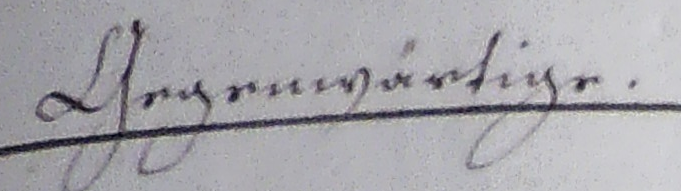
Gegenwärtige.
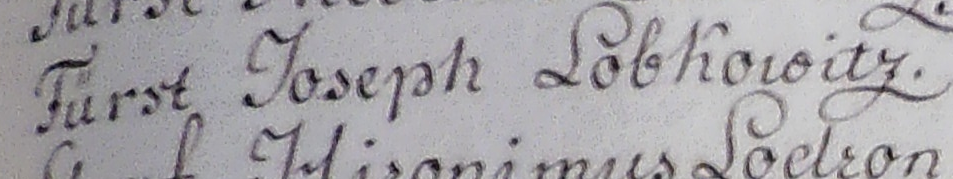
Fürst Joseph Lobkowitz.
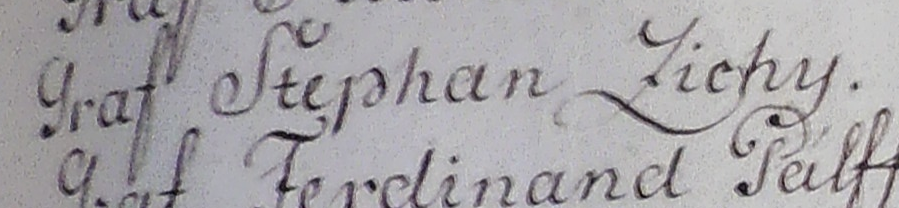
Graf Stephan Zichy.
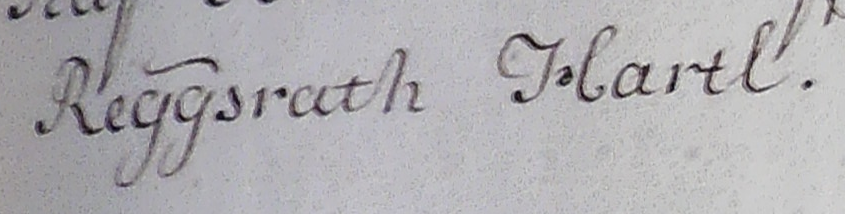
Reg͞gsrath Hartl.
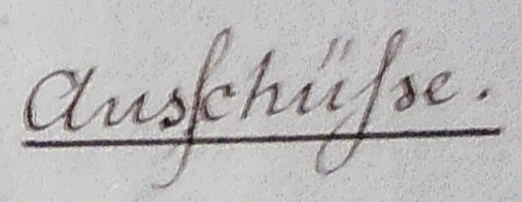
Ausschüsse.
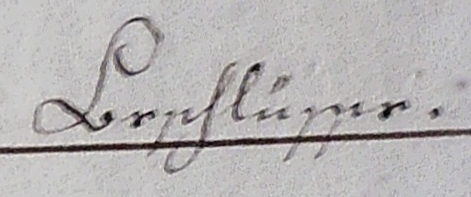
Beschlüsse.
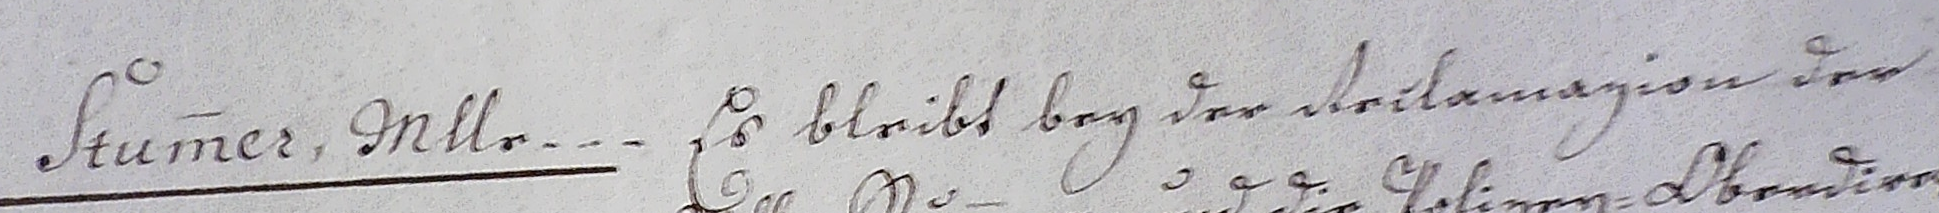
Stum̅er, Mlle .. .. .. Es bleibt bey der Reclamazion der
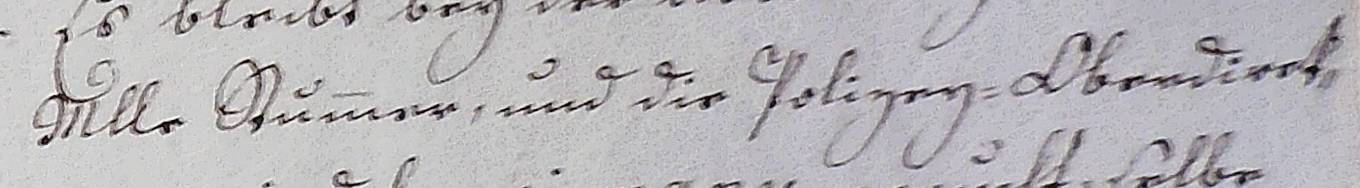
Mlle Stum̅er, uind die Polizey Oberdirek¬
